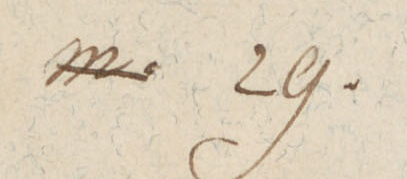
m. 29.
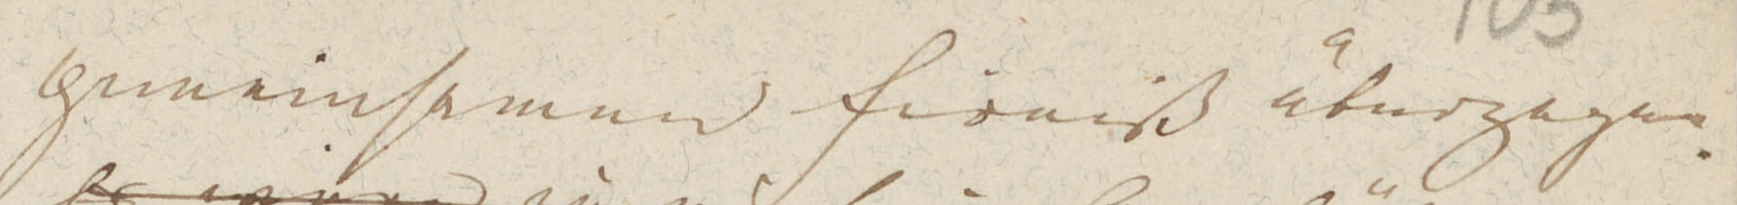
gemeinsamen Firniss überzogen.
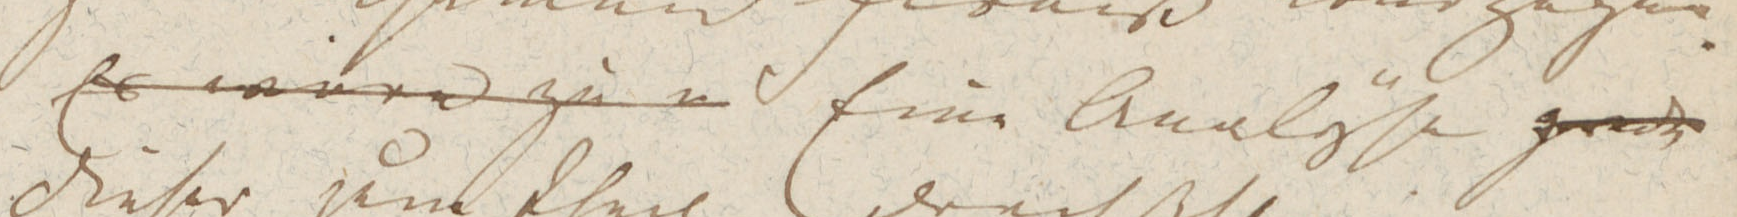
Es wäre zu Eine Analyse grade
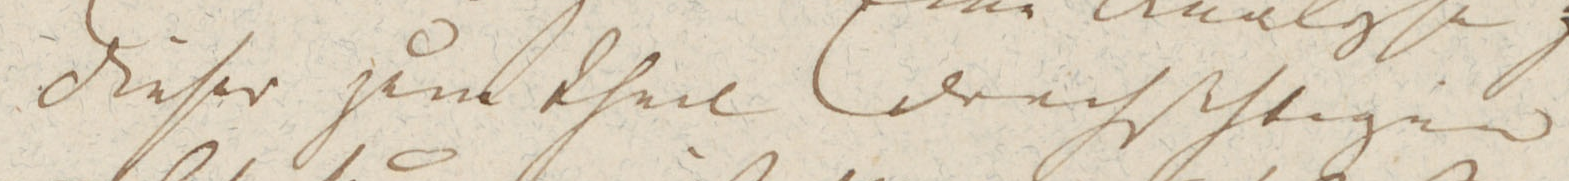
dieser zum Theil durchsichtigen
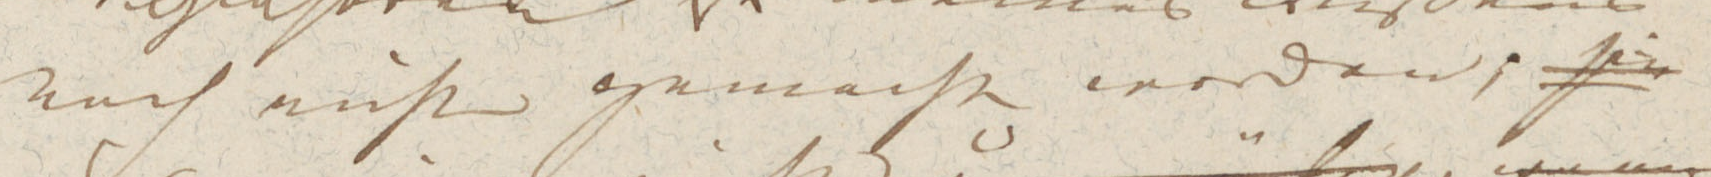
noch nicht gemacht worden; sie
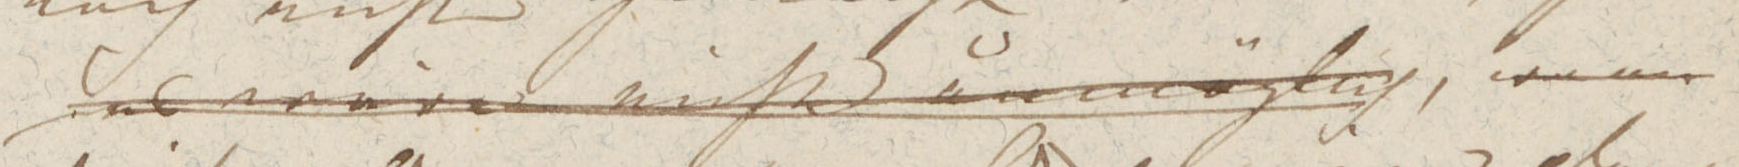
es wäre nicht unmöglich, wenn
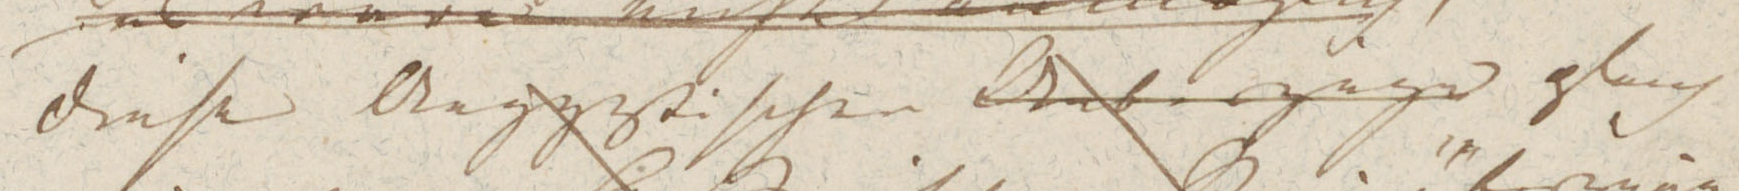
diese Aegyptischen Ueberzüge gleich
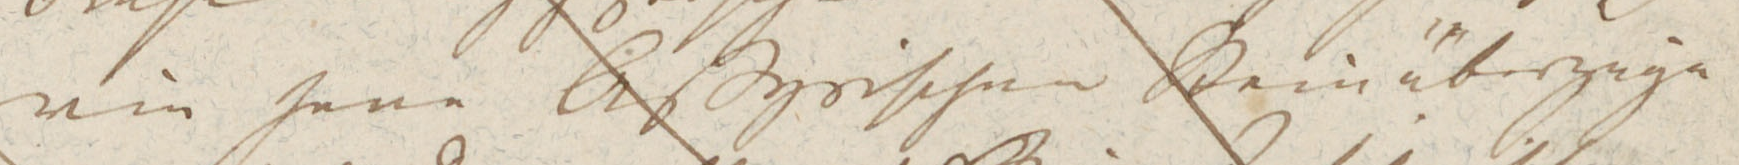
wie jene Assyrischen Steinüberzüge
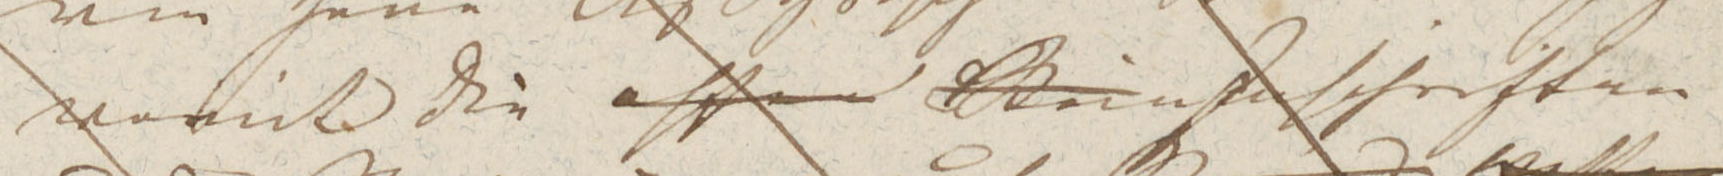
womit die offen SteiniInschriften
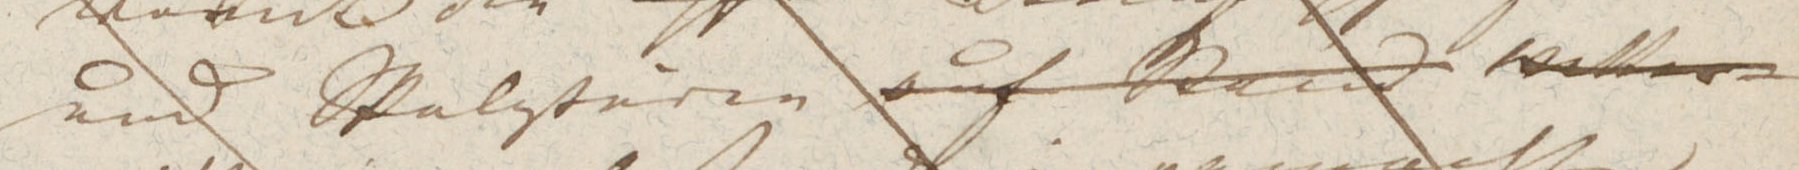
und Skulpturen auf Stein witter-
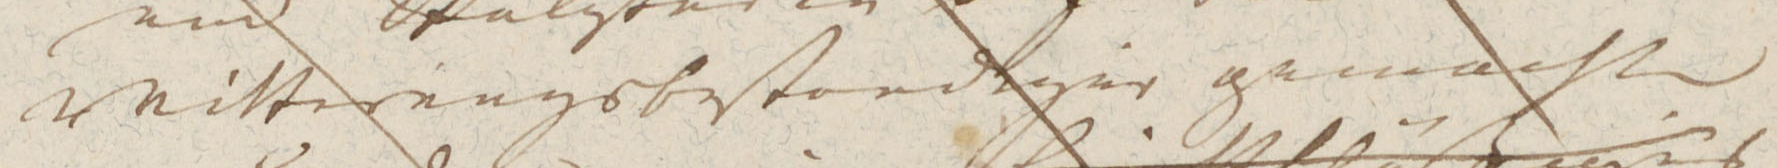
witterungsbestandiger gemacht
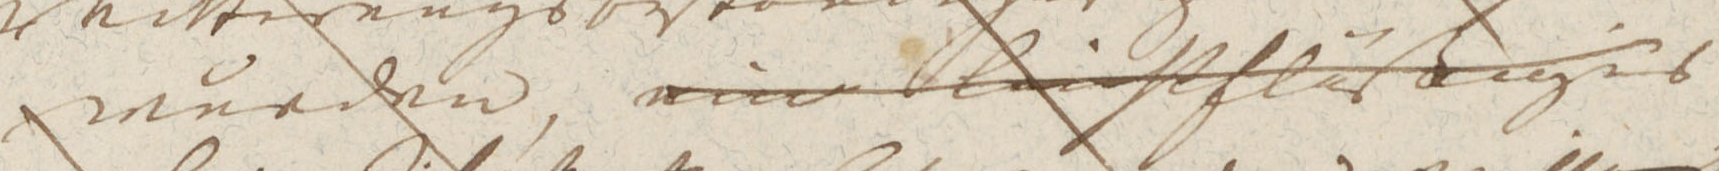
wurden, ein leichtflüssiges
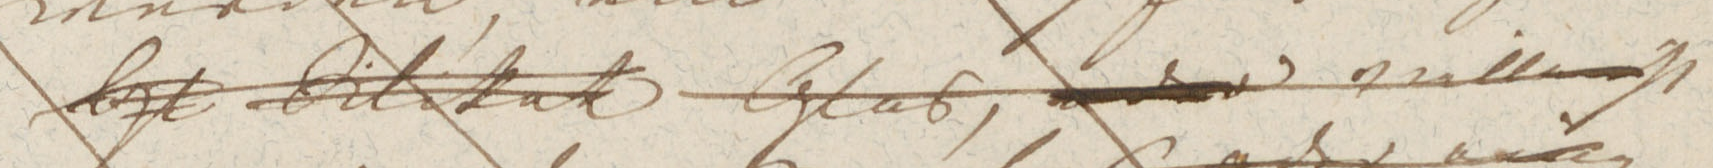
Gl Silikek Glas, oder vielleicht
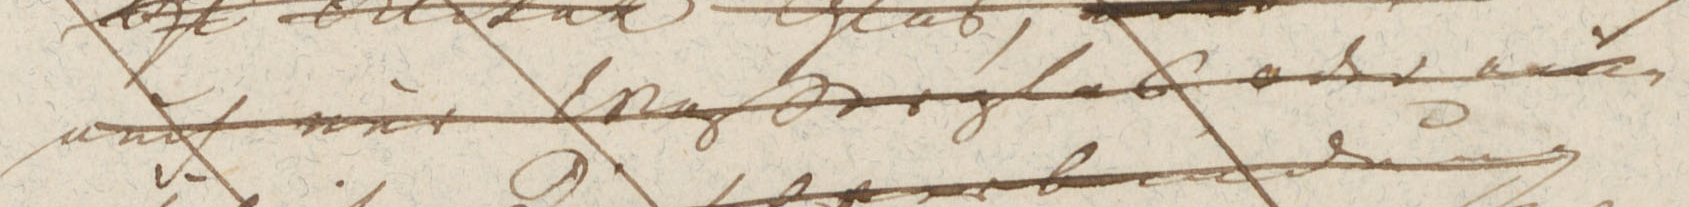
auch nur Wasserglas oder eine
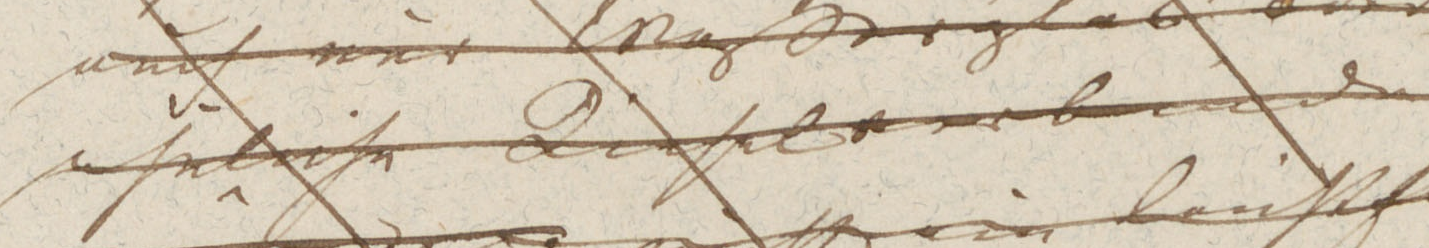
ähnliche Kieselverbindung
